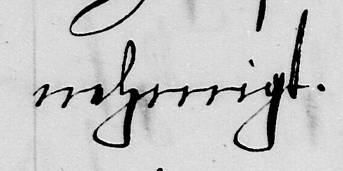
nehmigt.
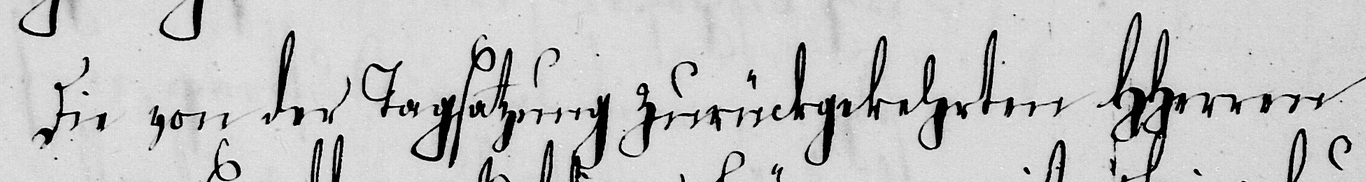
Die von der Tagsatzung zurückgekehrten HHerren
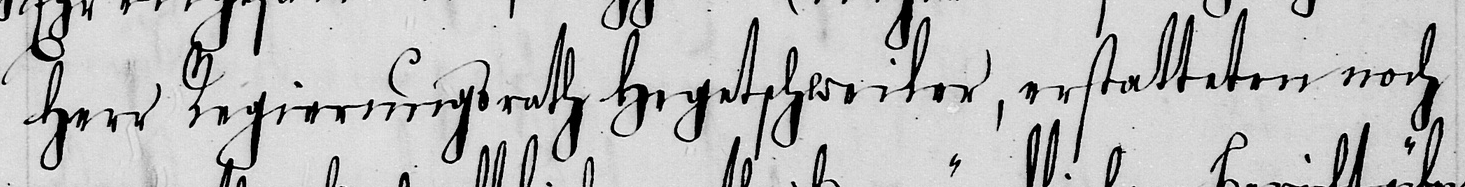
Herr Regierungsrath Hegetschweiler, erstatteten noch
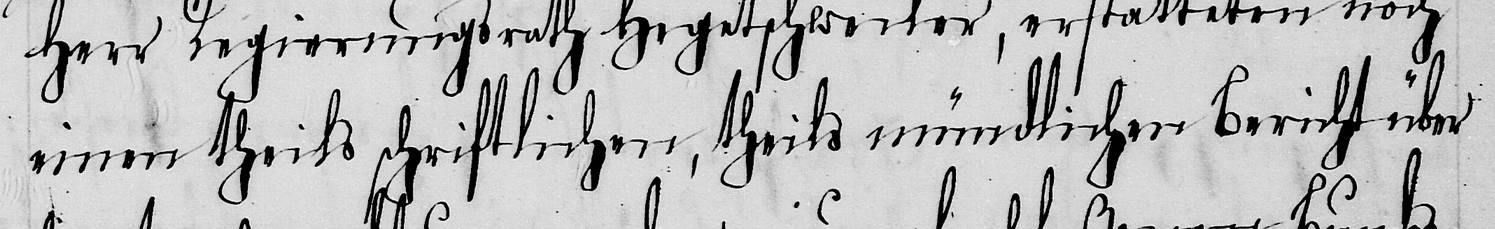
einen theils schriftlichen, theils mündlichen Bericht über
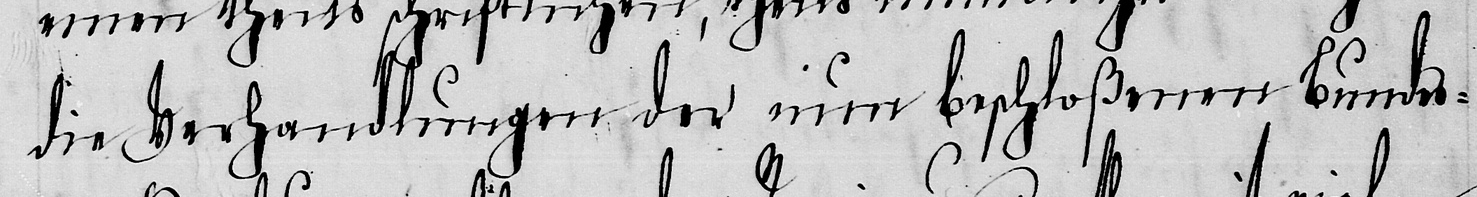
die Verhandlungen der nun beschloßenen Bundes¬
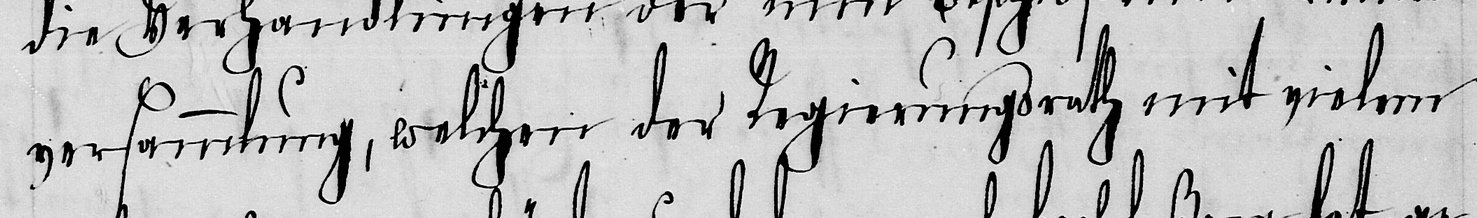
versammlung, welchen der Regierungsrath mit vielem
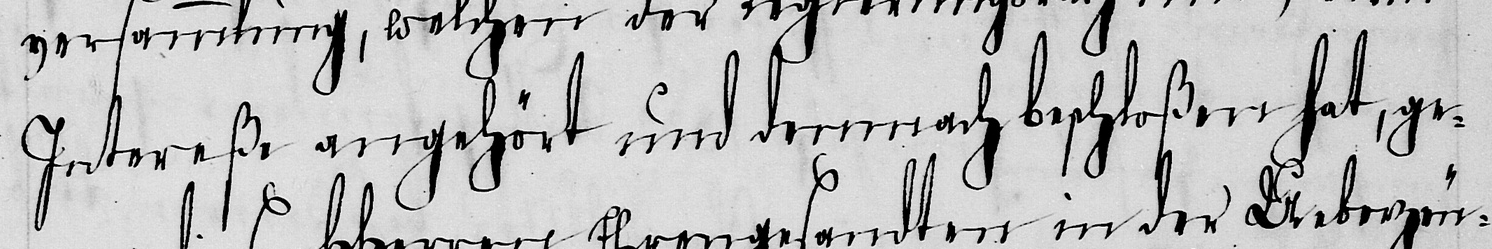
Intereße angehört und demnach beschloßen hat, ge¬
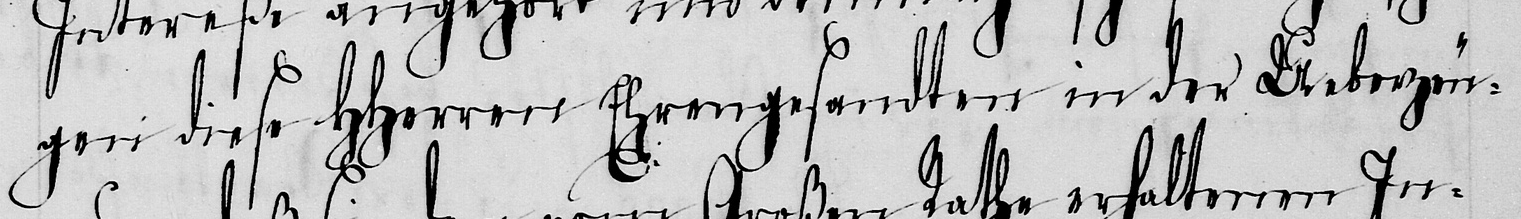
gen diese HHerren Ehrengesandten in der Ueberzeu¬
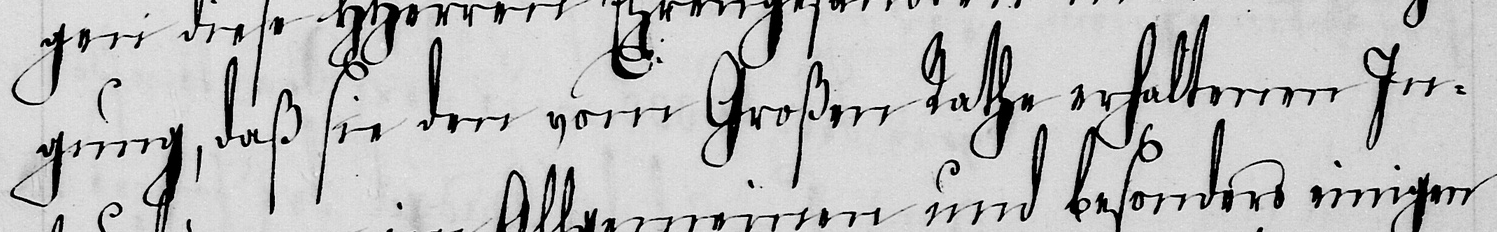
gung, daß sie den vom Großen Rathe erthaltenen In¬
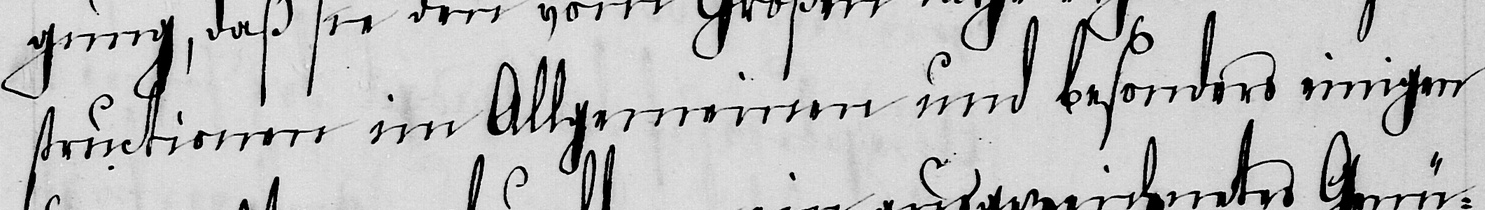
structionen im Allgemeinen und besonders einigen
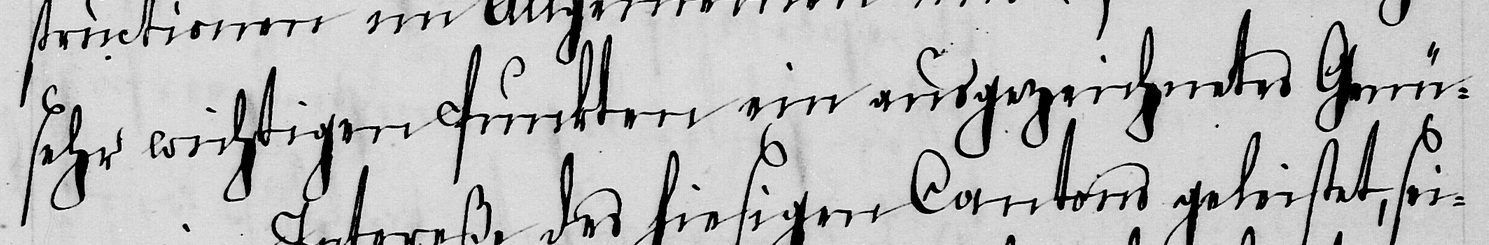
sehr wichtigen Punkten ein ausgezeichnetes Genü¬
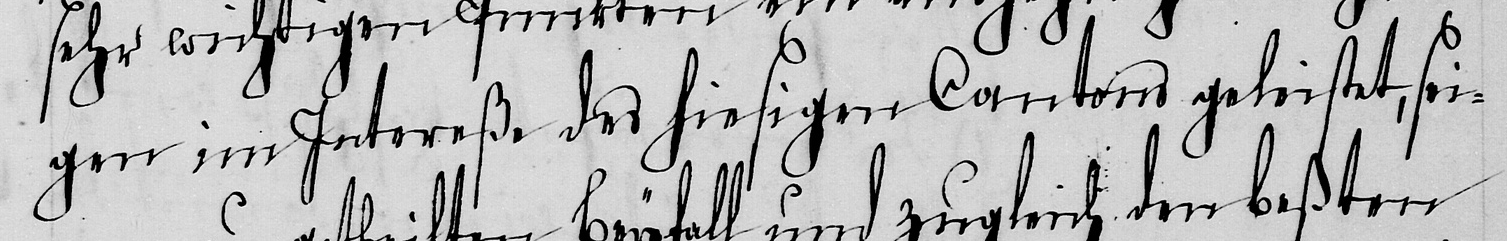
gen im Intereße des hiesigen Cantons geleistet, sei¬
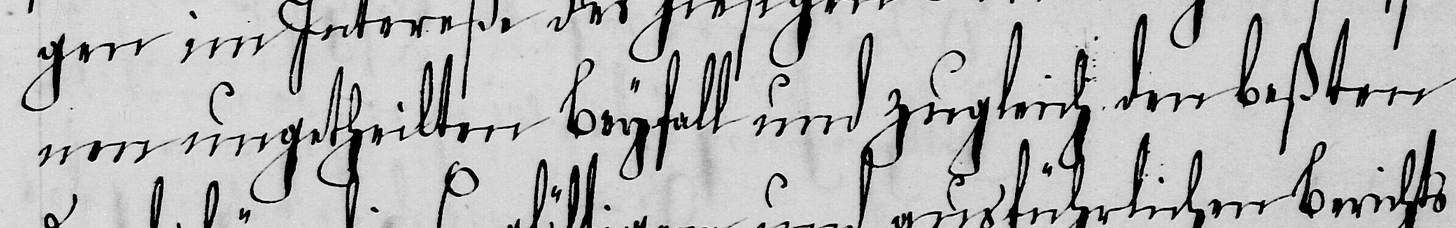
nen ungetheilten Beyfall und zugleich den beßten
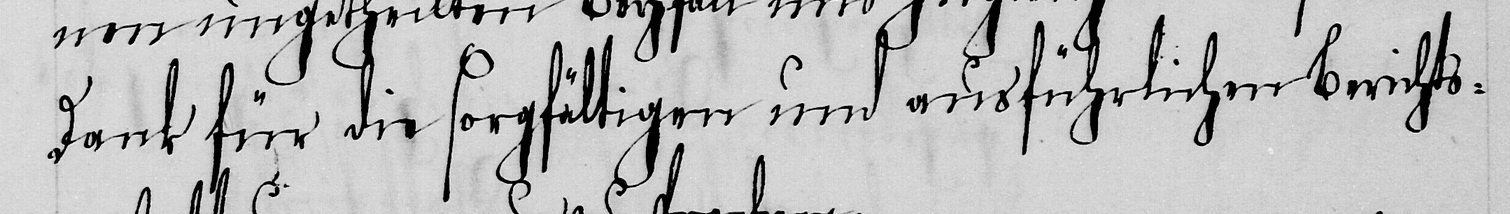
Dank für die sorgfältigen und ausführlichen Berichts¬
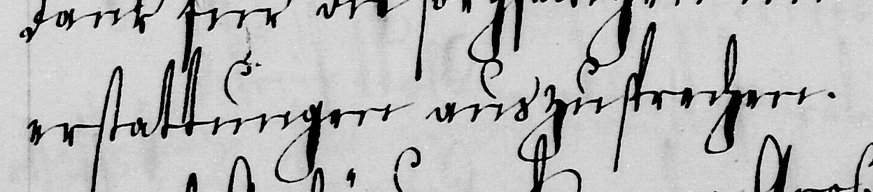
erstattungen auszusprechen.
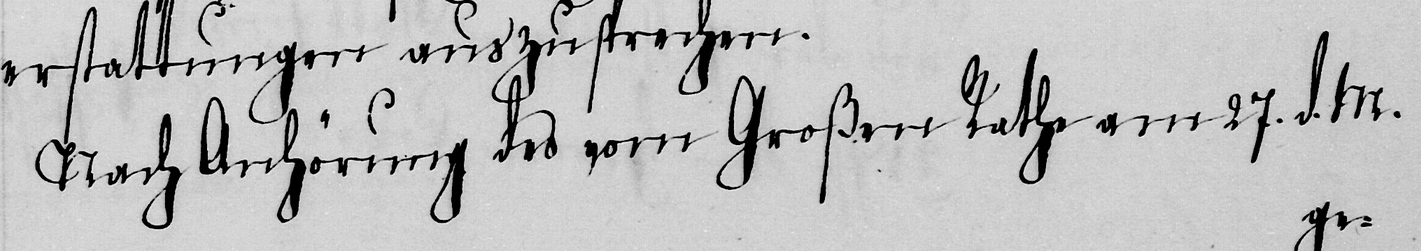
Nach Anhörung des vom Großen Rathe am 27. d. M.
